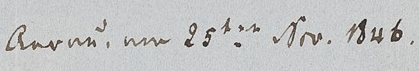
Aarau, am 25ten Nov. 1846.
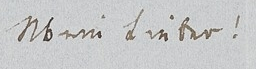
Mein Lieber!
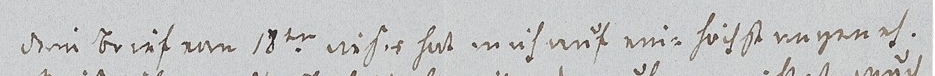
Dein Brief vom 18ten dieses hat mich auf eine höchst angeneh-
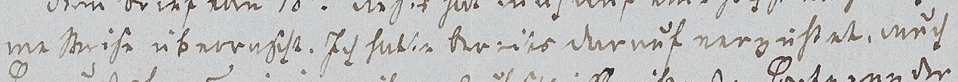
me Weise überrascht. Ich hatte bereits darauf verzichtet, durch
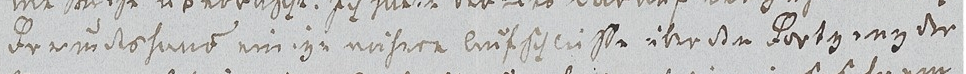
Freundeshand einige nähere Aufschlüsse über den Fortgang der
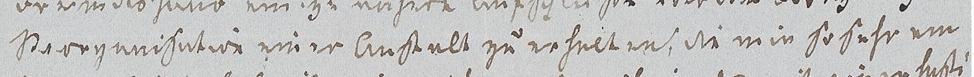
Reorganisation einer Anstalt zu erhalten, die mir so sehr am
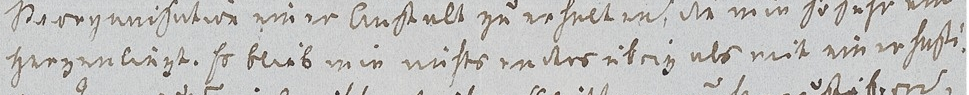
Herzen liegt. Es blieb mir nichts anders übrig als mit einer hasti-
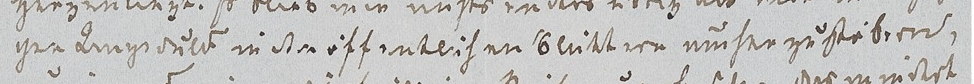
gen Ungeduld in den öffentlichen Blättern umher zu stöbern,
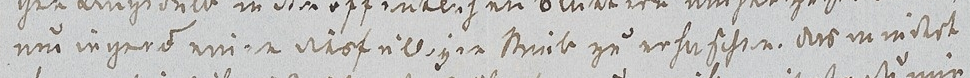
um irgend einen diesfälligen Wink zu erhaschen. Das mindert
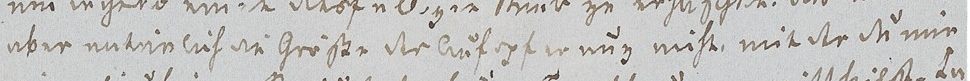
aber natürlich die Größe der Aufopferung nicht, mit der du mir
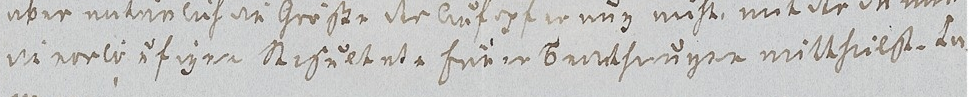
die vorläufigen Resultate Eurer Berathungen mittheist. Ca-
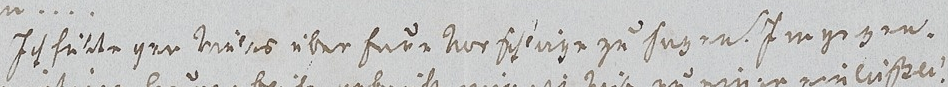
Ich hätte gar Vieles über Eure Vorschläge zu sagen. Im gegen-
